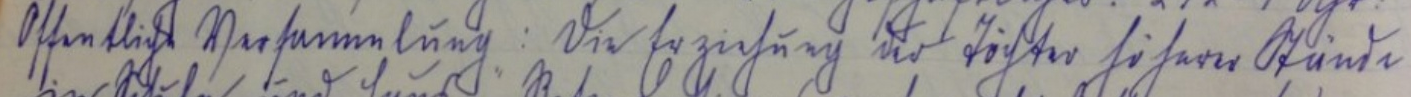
öffentliche Versammlung Die Erziehung der Töchter höherer Stände
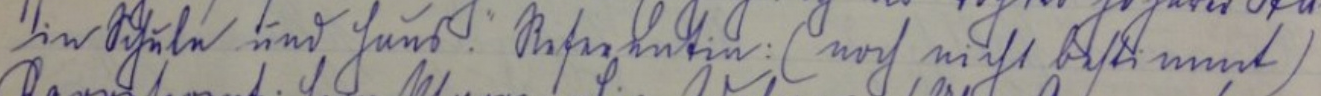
in Schule und Haus. Referentin: (noch nicht bestimmt).
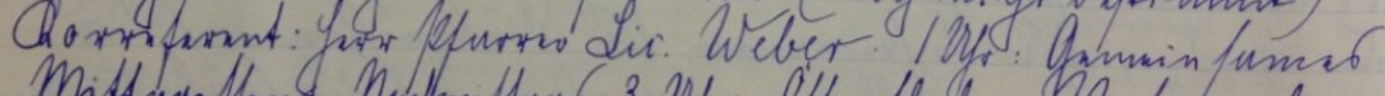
Correferent: Herr Pfarrer Lic. Weber. 1 Uhr: gemeinsames
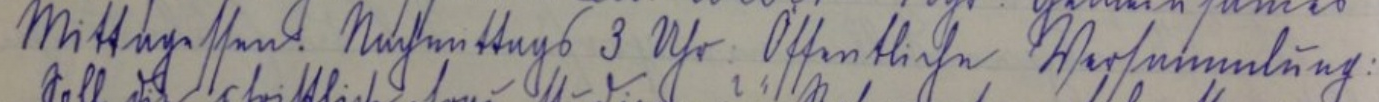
Mittagessen. Nachmittags 3 Uhr Öffentliche Versammlung:
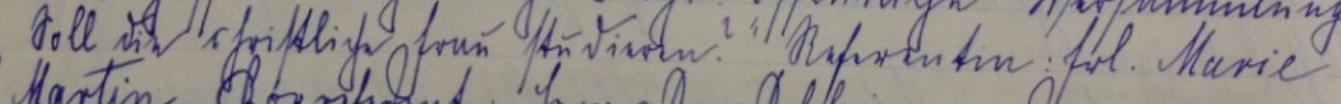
„Soll die christliche Frau studieren?" Referentin Frl. Marie
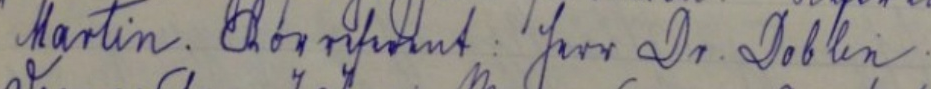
Martin. Correferent Herr Dr. Doblen.
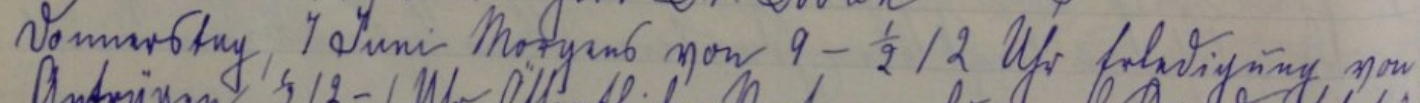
Donnerstag, 7. Juni Morgens von 9-½12 Uhr Erledigung von
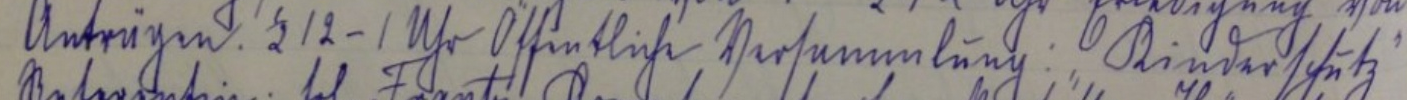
Anträgen ½12-1 Uhr Öffentliche Versammlung: „Kinderschutz"
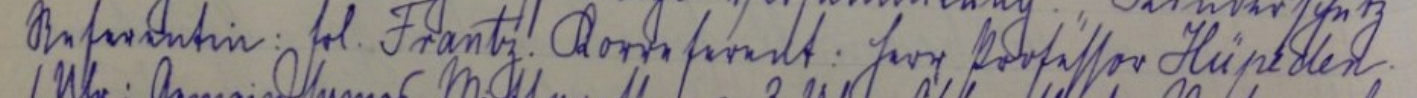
Referentin: Frl. Frantz. Correferent Herr Pfarrer Hüpeden.
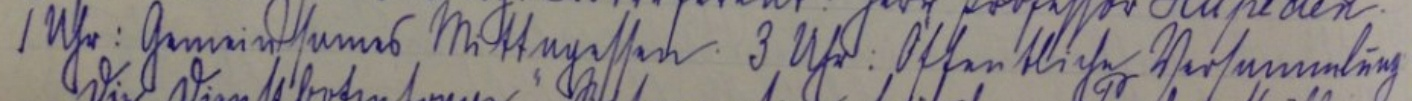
1 Uhr: Gemeinsames Mitagessen 3 Uhr Öffentliche Versamllung
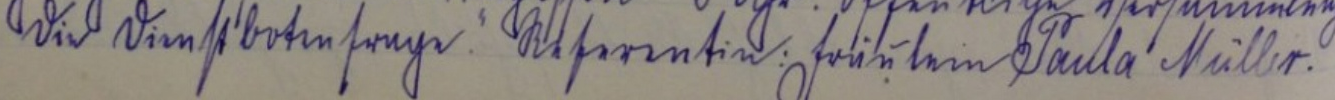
„Die Dienstbotenfrage" Referentin: Fräulein Paula Müller.
